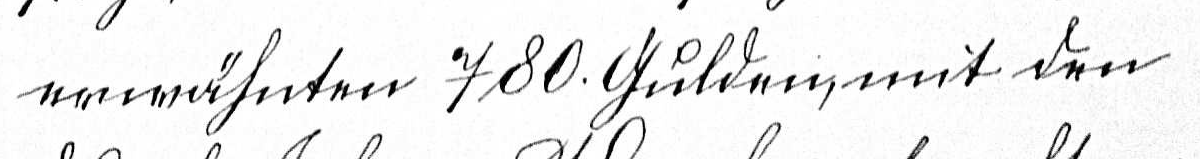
erwähnten 780 Gulden, mit den
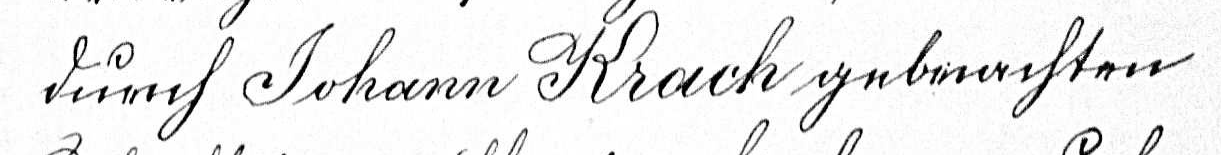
durch Johann Krach gebrachten
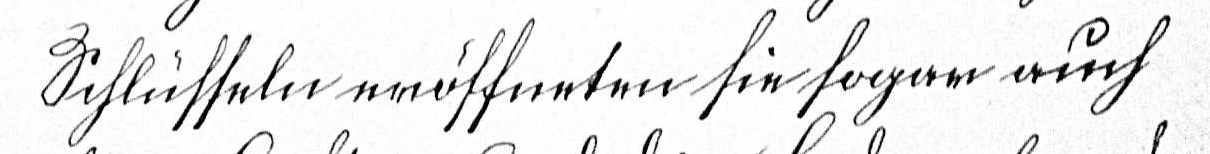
Schlüsseln eröffneten sie sogar auch
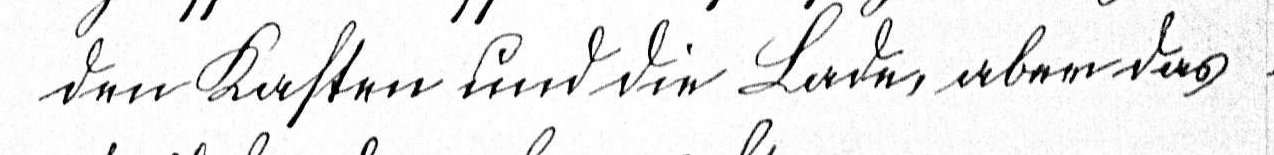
den Kasten und die Lade, aber das
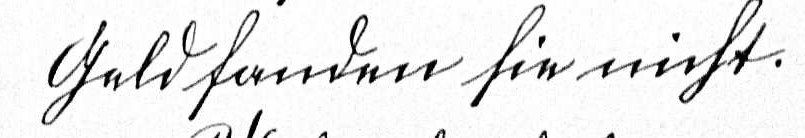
Geldfanden sie nicht.
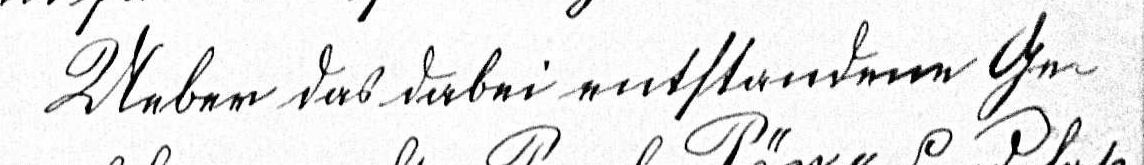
Ueber das dabei entstandenen Ge¬
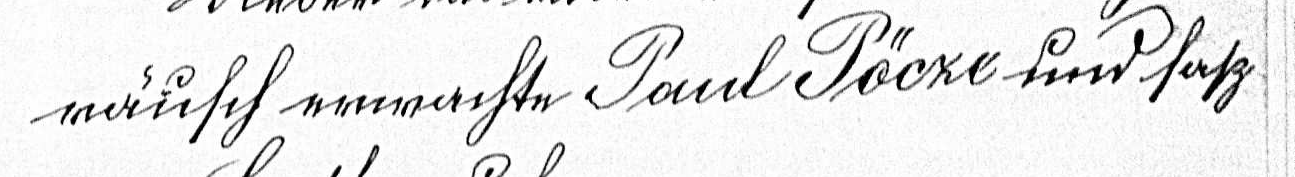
räusch erwachte Paul Pöcze und saß
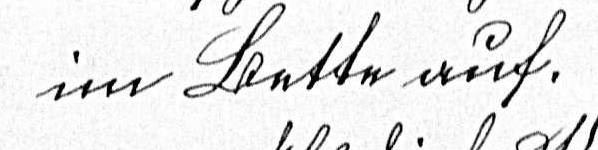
im Bette auf.
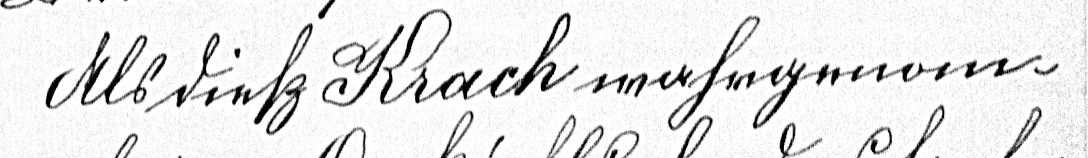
Als dieß Krach wahrgenom¬
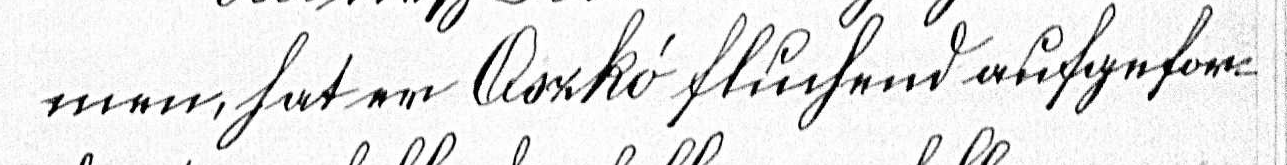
men, hat er Oszkó fluchend aufgefor¬
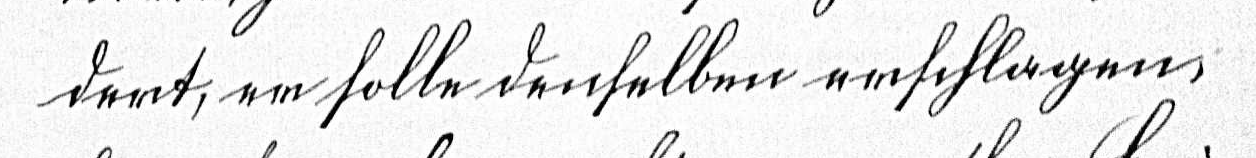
dert, er solle denselben erschlagen,
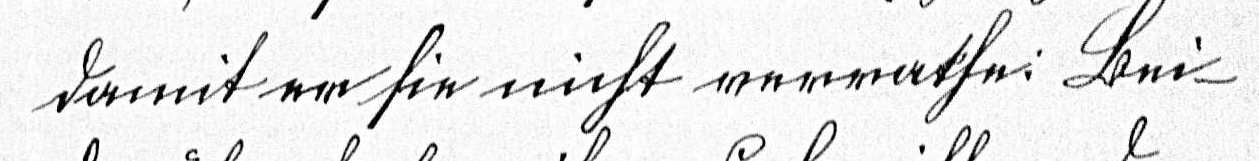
damit er sie nicht verrathe. Bei¬
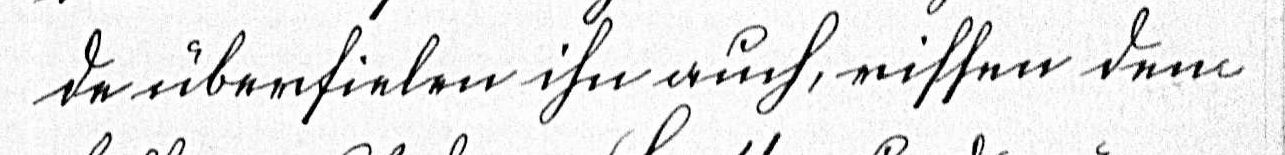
de überfielen ihn auch, rissen dem
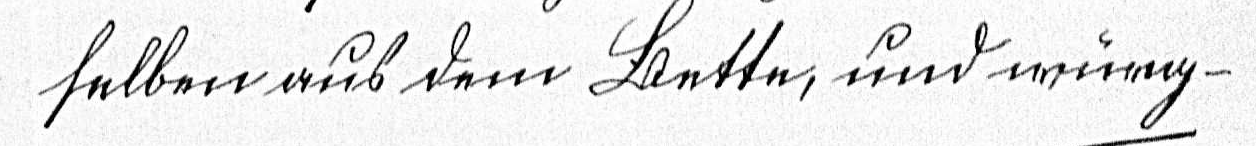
selben aus dem Bette, und würg¬
